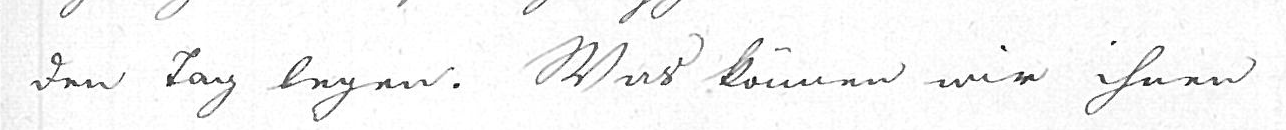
den Tag legen. Was können wie ihnen
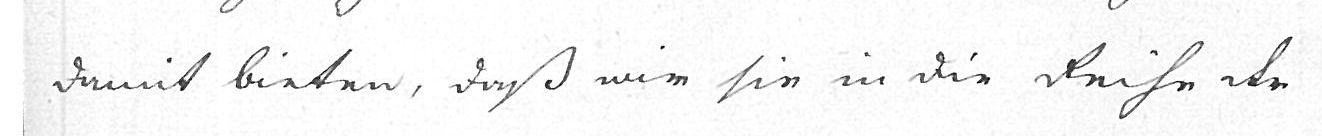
damit bieten, daß wir sie in die Reihe der
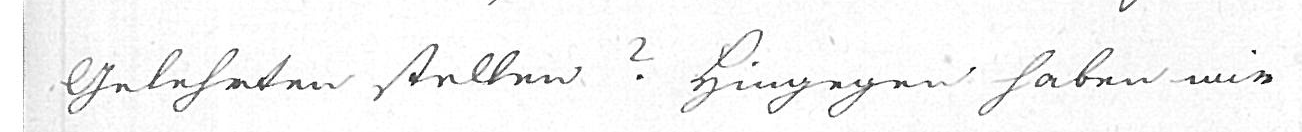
Gelehrten stellen? Hingegen haben wir
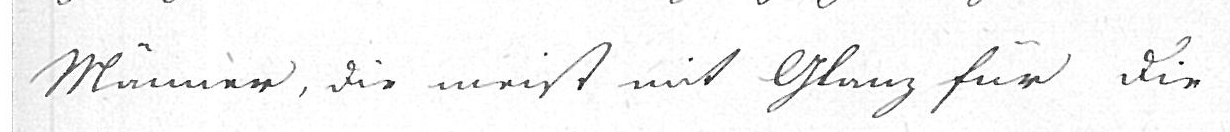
Männer, die meist mit Glanz für die
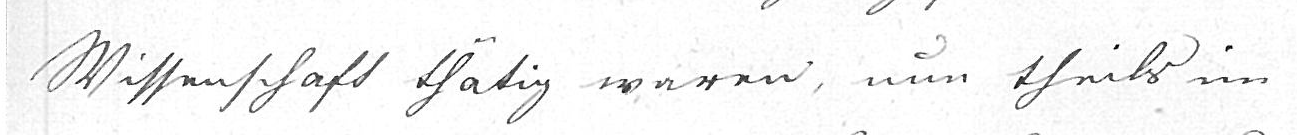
Wissenschaft thätig waren, nun theils im
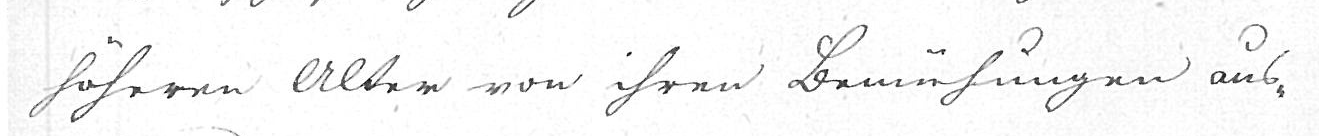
höheren Alter von ihren Bemühungen aus-
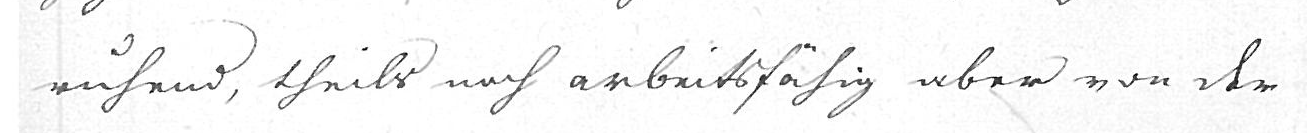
ruhend, theils noch arbeitsfähig, aber von der
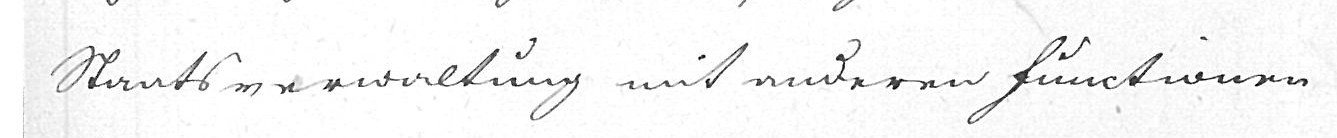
Staatsverwaltung mit sneren Functionen
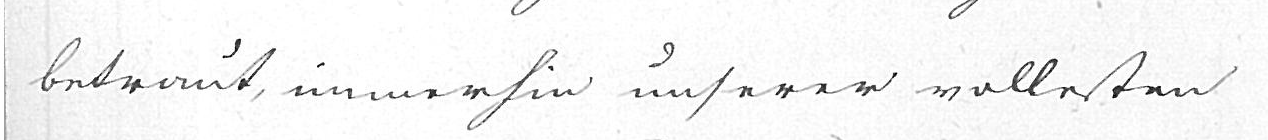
betraut, immerhin unserer vollesten
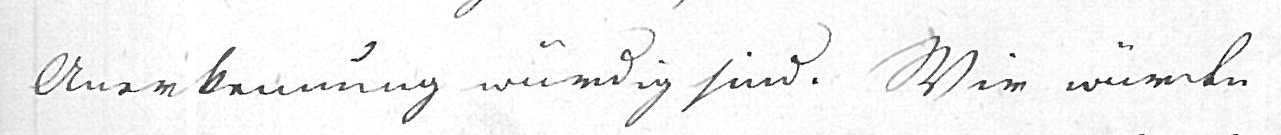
Anerkennung würdig sind. Wir würden
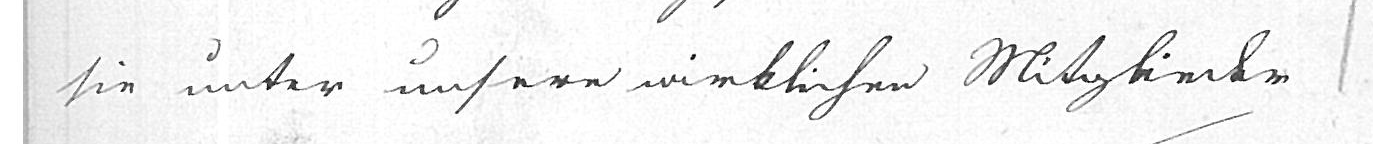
sie unter unsere wirklichen Mitglieder
